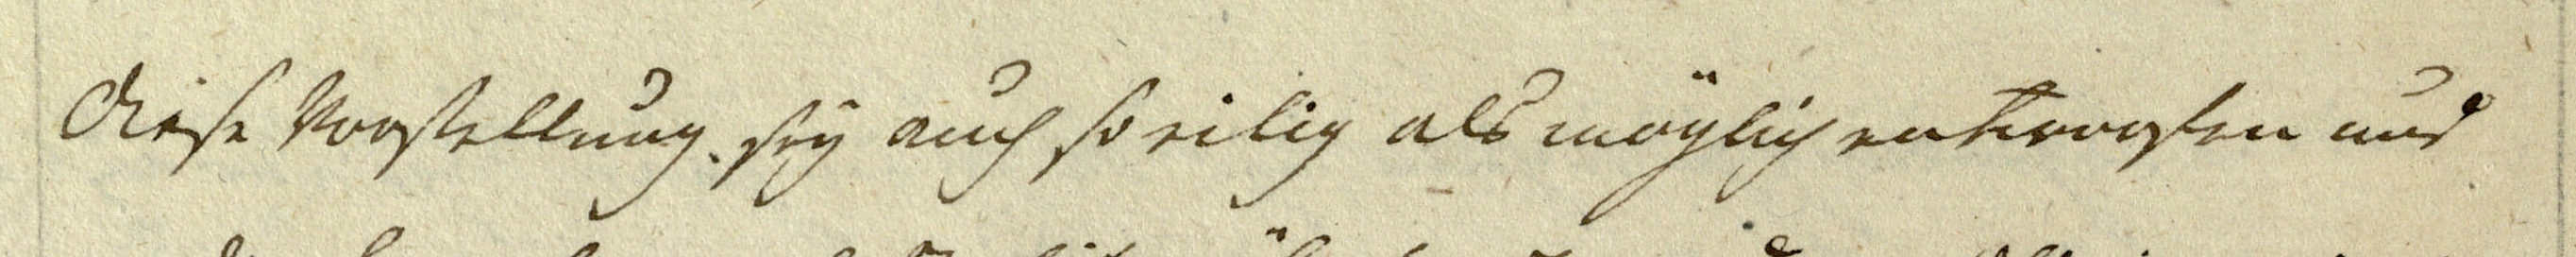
Diese Vorstellung seÿ auch so eilig als möglich entworfen und
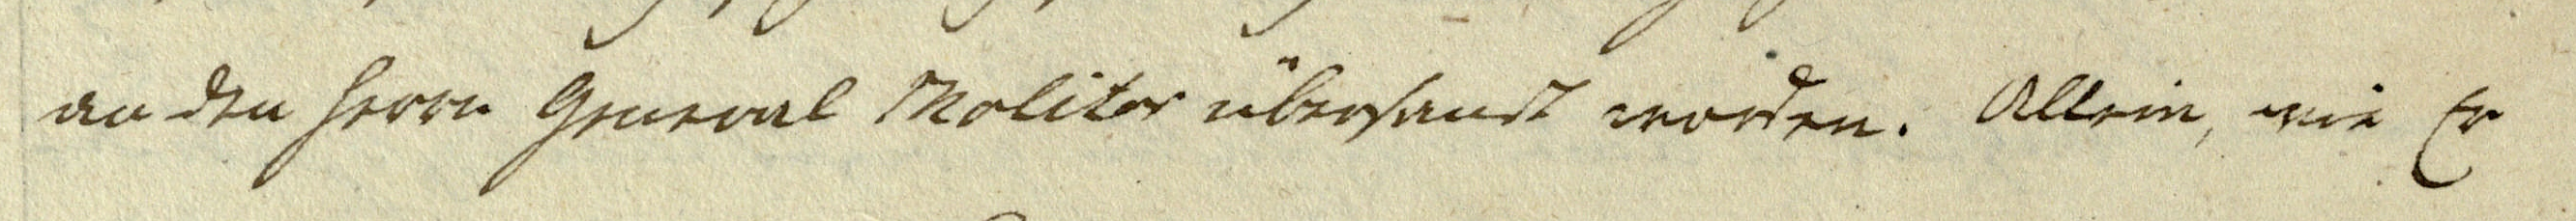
an den Herrn General Molitor übersandt worden. Allein, wie Er
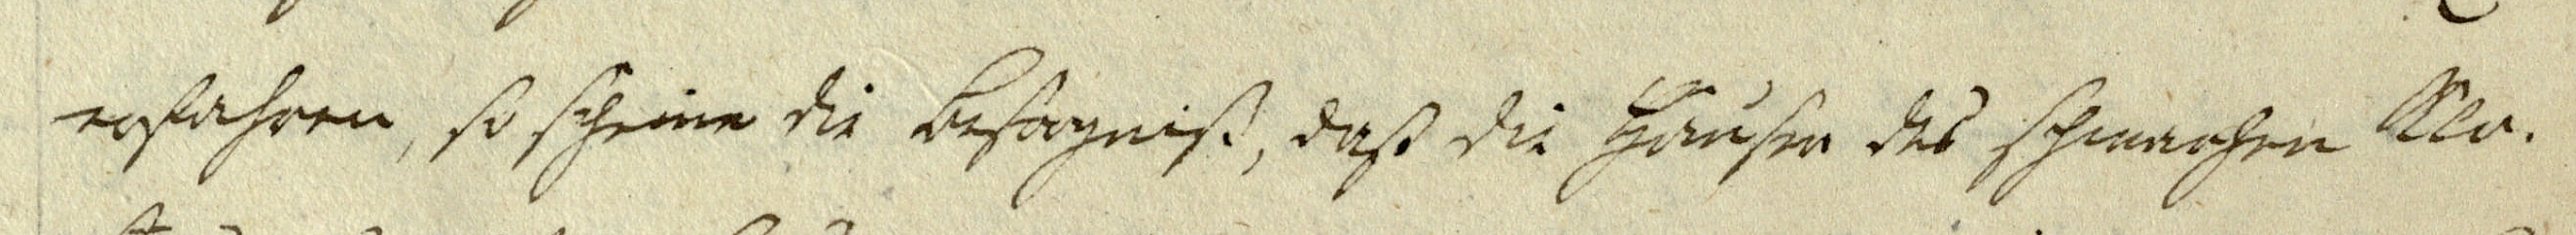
erfahren, so scheine die Besorgnis, daß die Häuser des schwarzen Klo¬
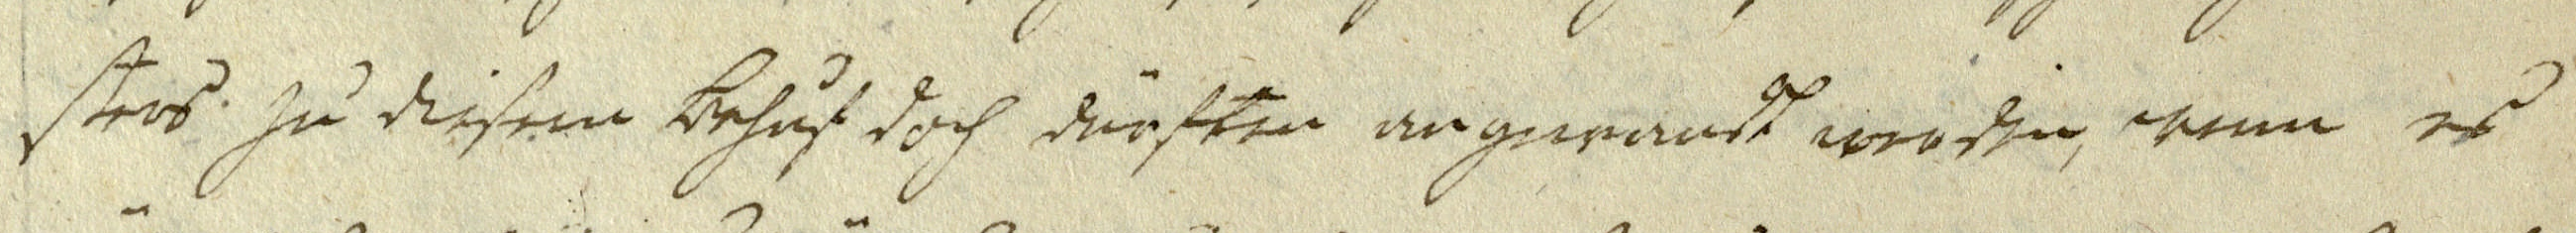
sters zu diesem Behuf doch dürften angewandt werden, wenn es
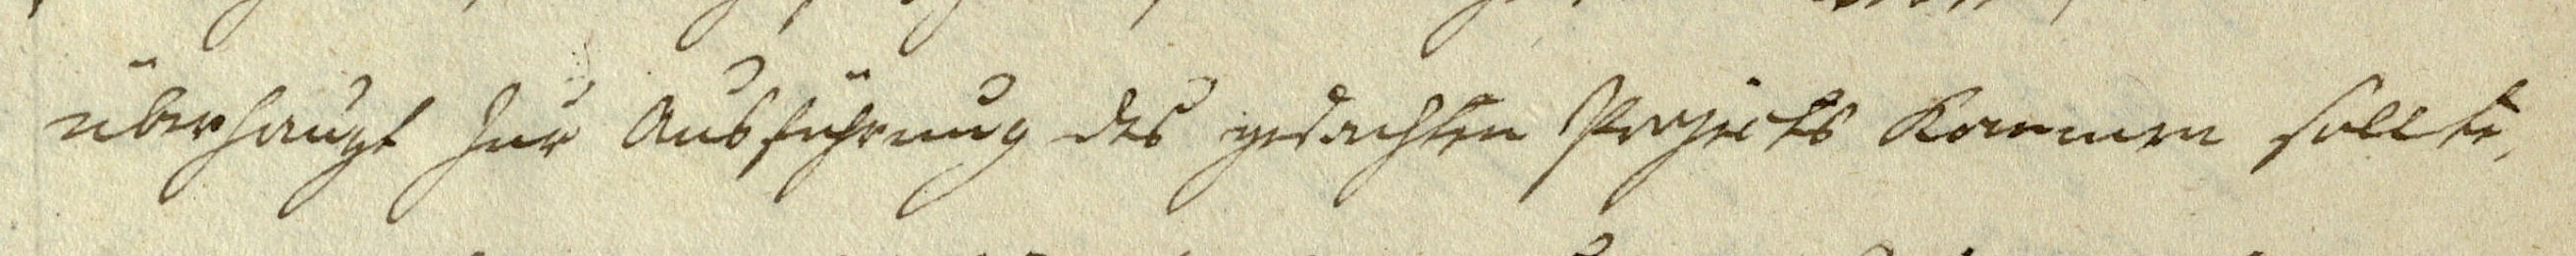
überhaupt zur Ausführung des gedachten Projects kommen sollte
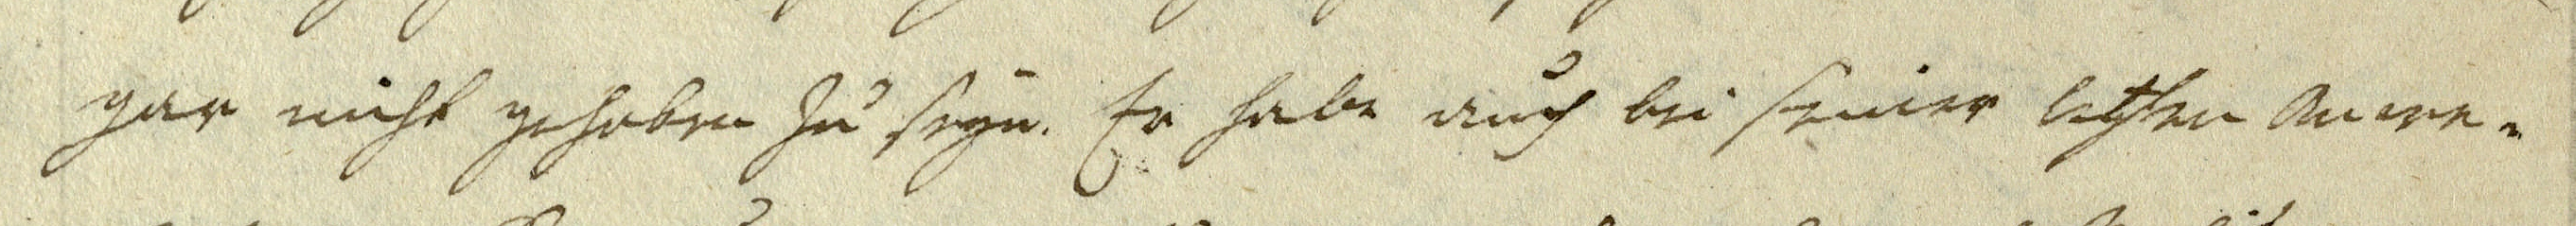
gar nicht gehoben zu seÿn. Er habe auch bei seiner letzten Anwe¬
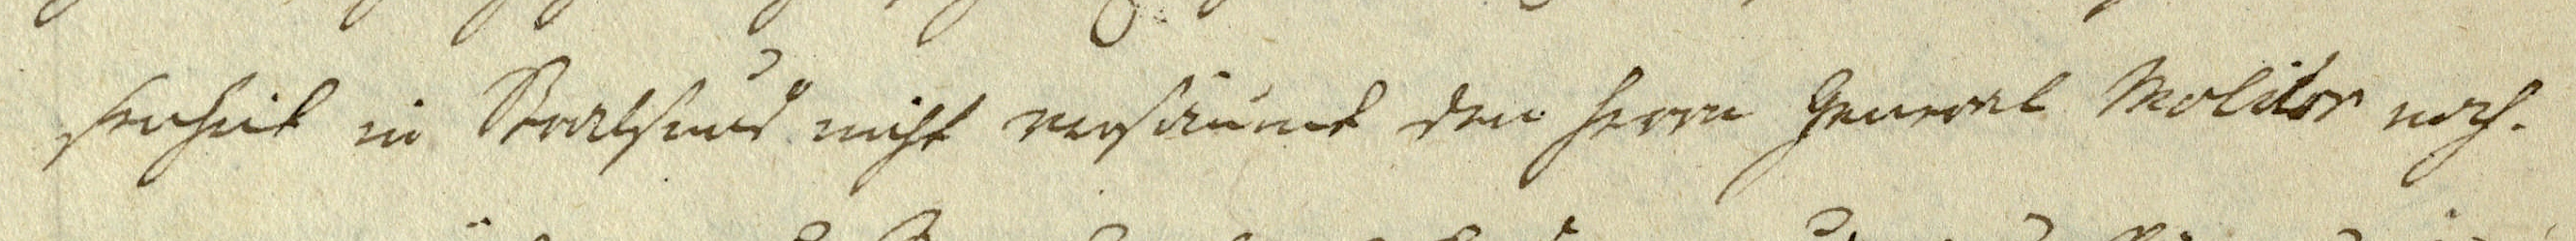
senheit in Stralsund nicht versäumt, dem Herrn General Molitor noch¬
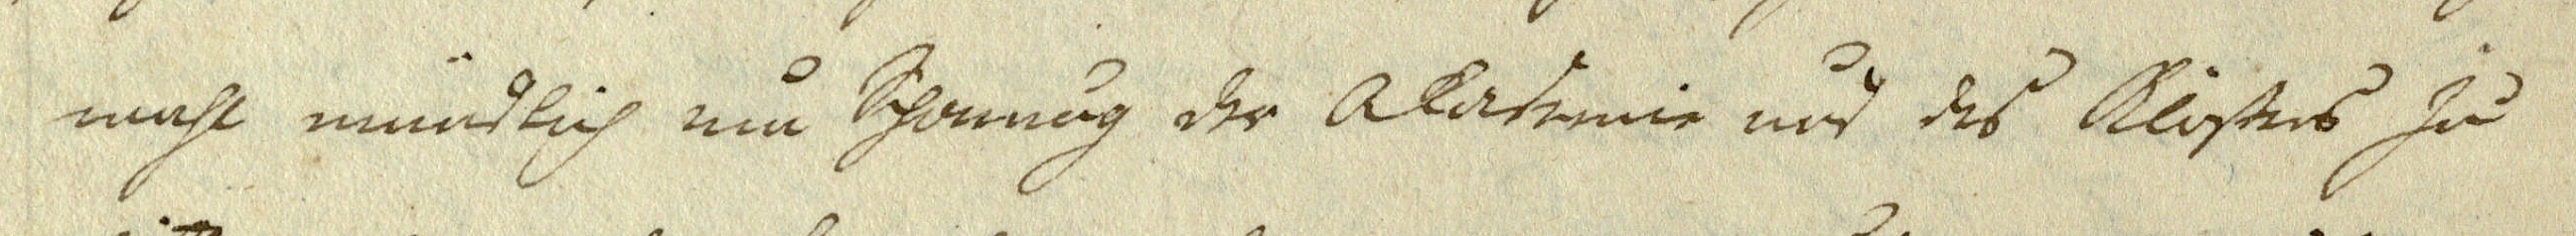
mahl mündlich um Schonung der Akademie und des Klosters zu
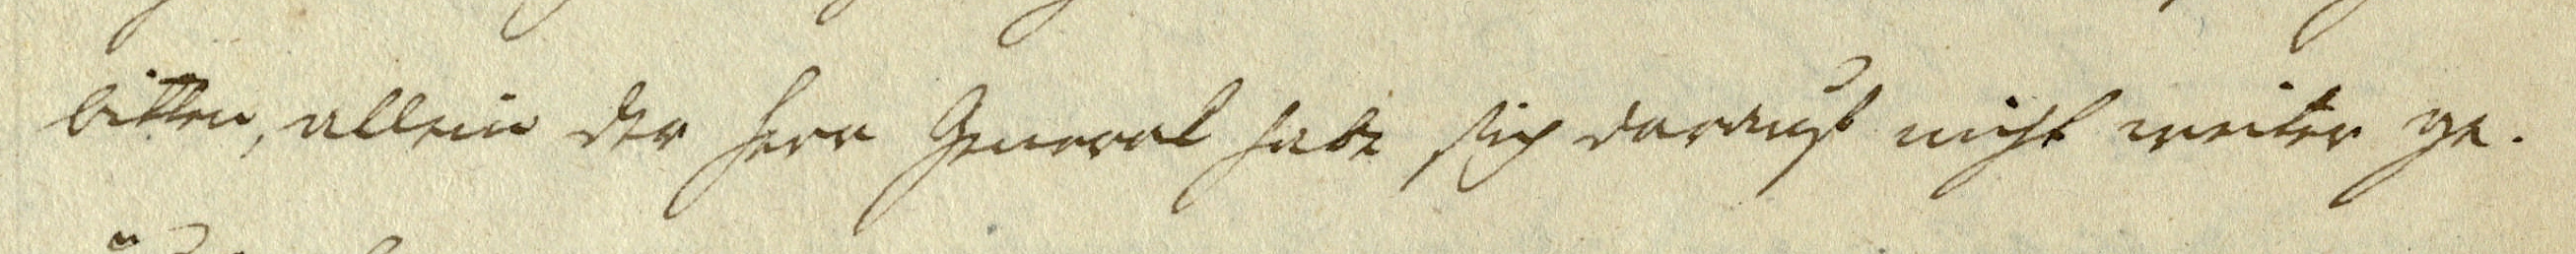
bitten, allein der Herr General habe sich darauf nicht weiter ge¬
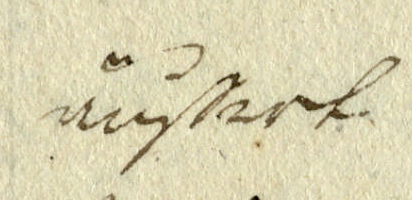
äußert.
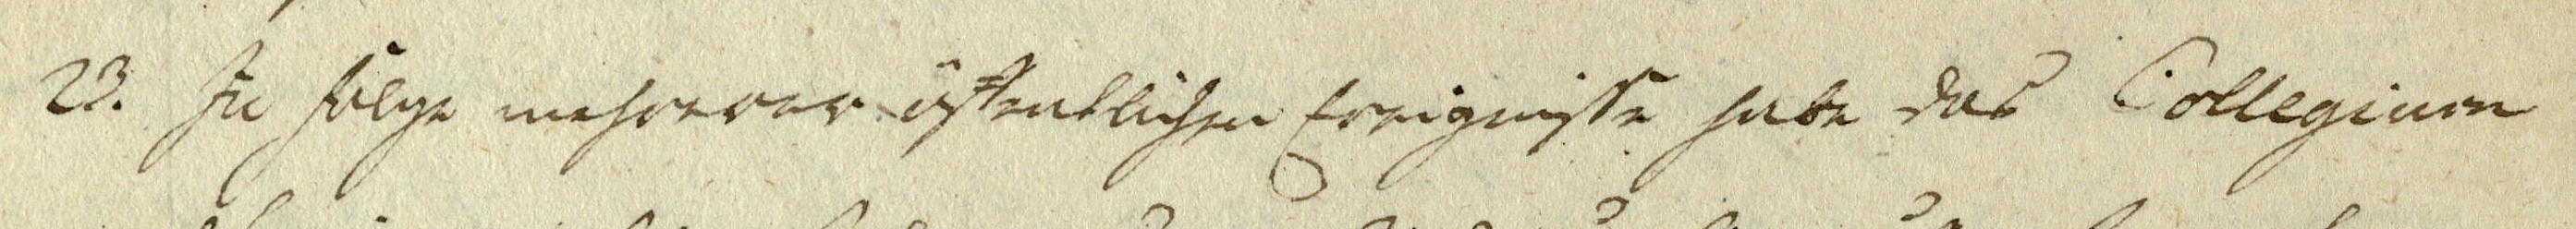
23. In Folge mehrerer öffentlicher Ereignisse habe das Collegium
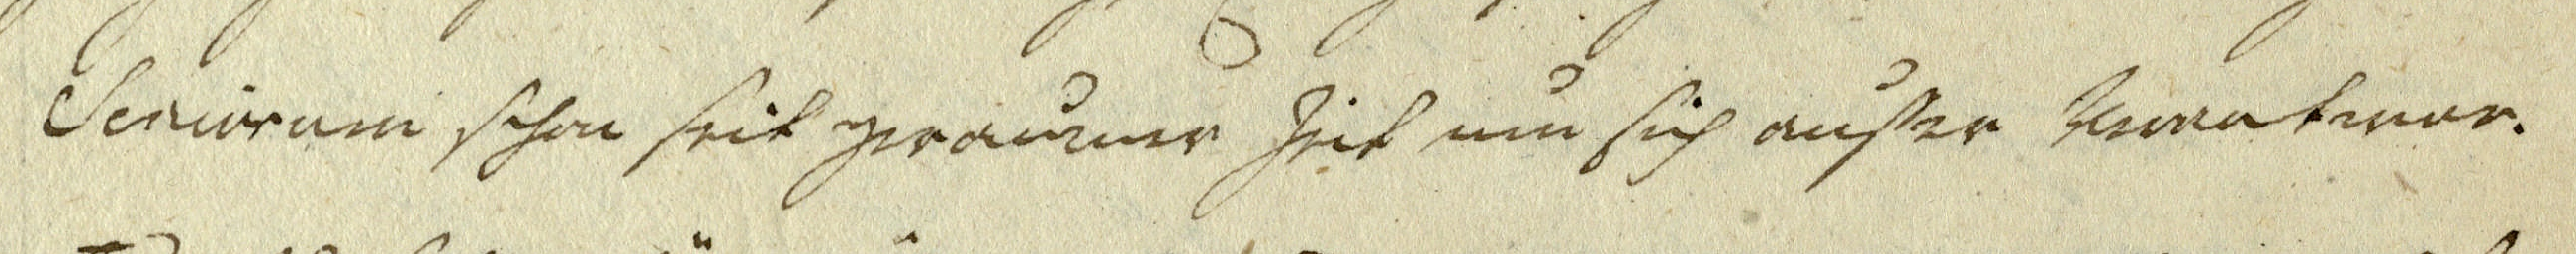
Seniorum schon seit geraumer Zeit um sich ausser Verantwor¬
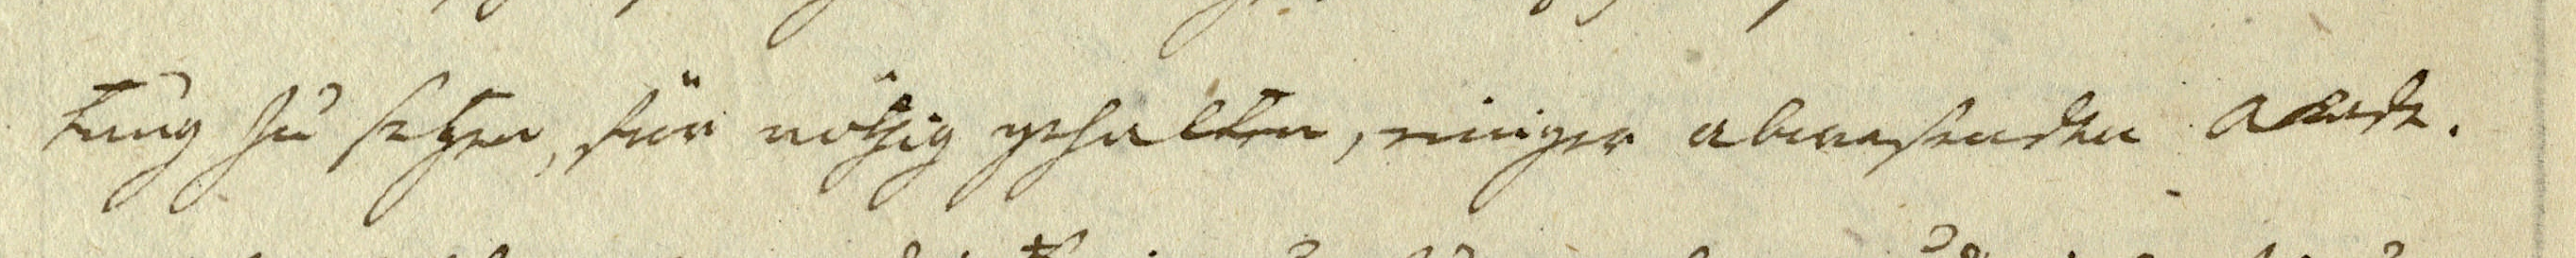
tung zu setzen, für nöthig gehalten, einiger abwesenden Akade¬
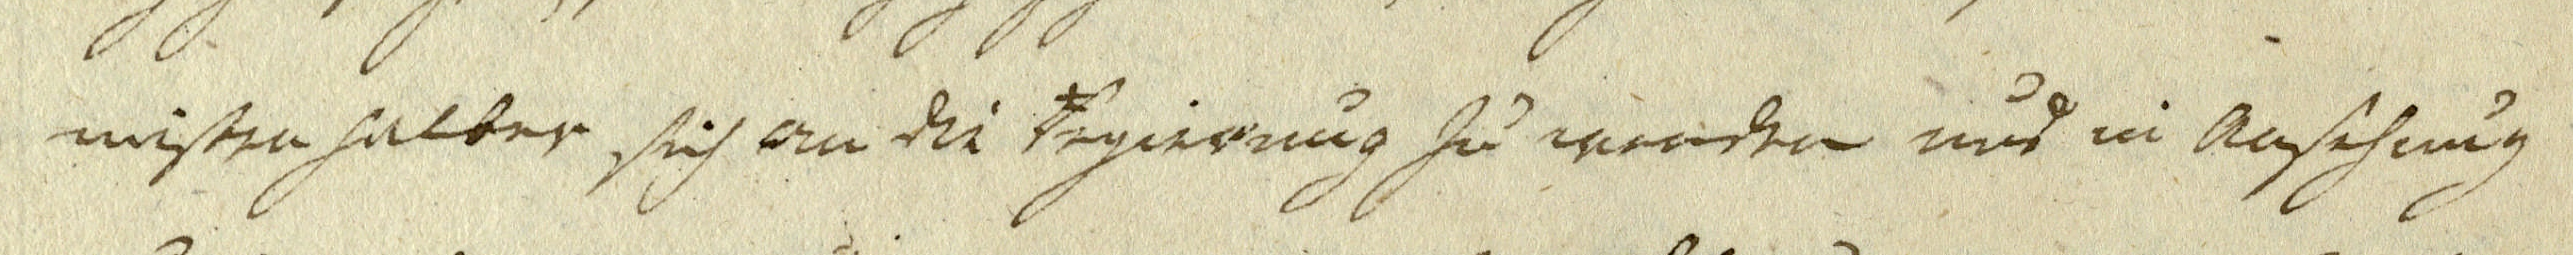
misten halber sich an die Regierung zu wenden und in Ansehung
